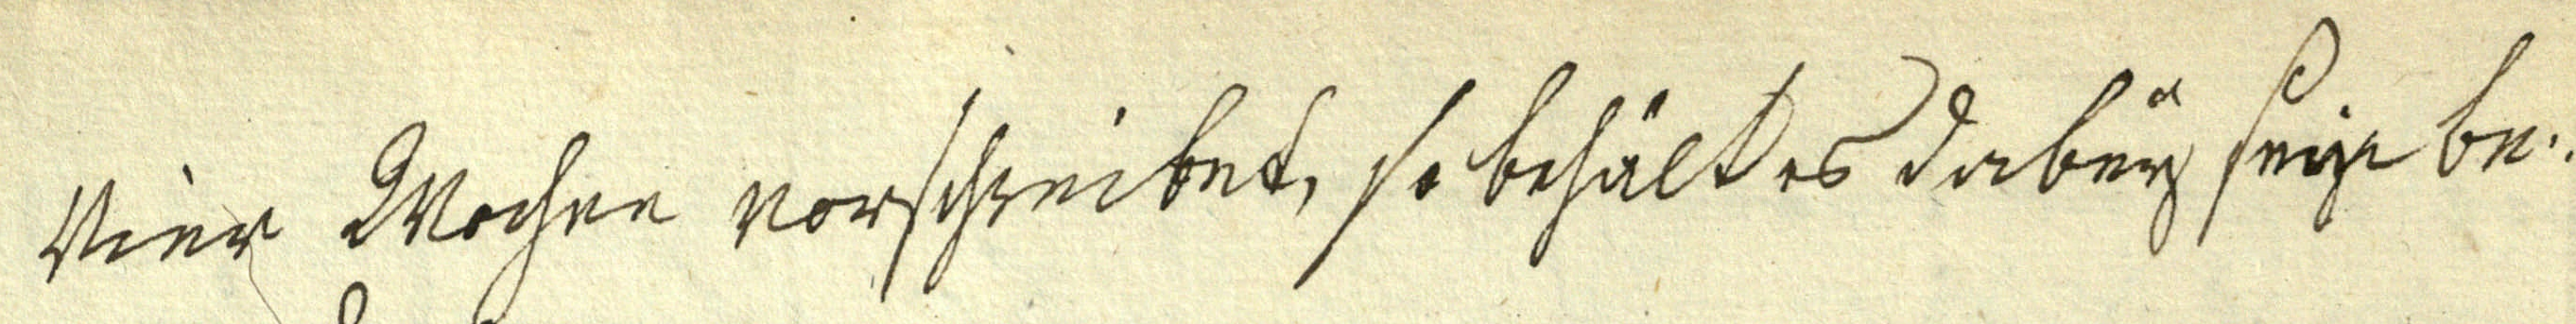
vier Wochen vorschreibet, so behält es dabeÿ seÿn Be¬
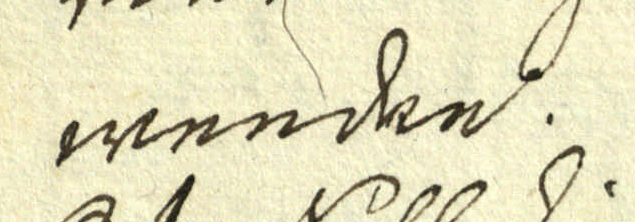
wenden.
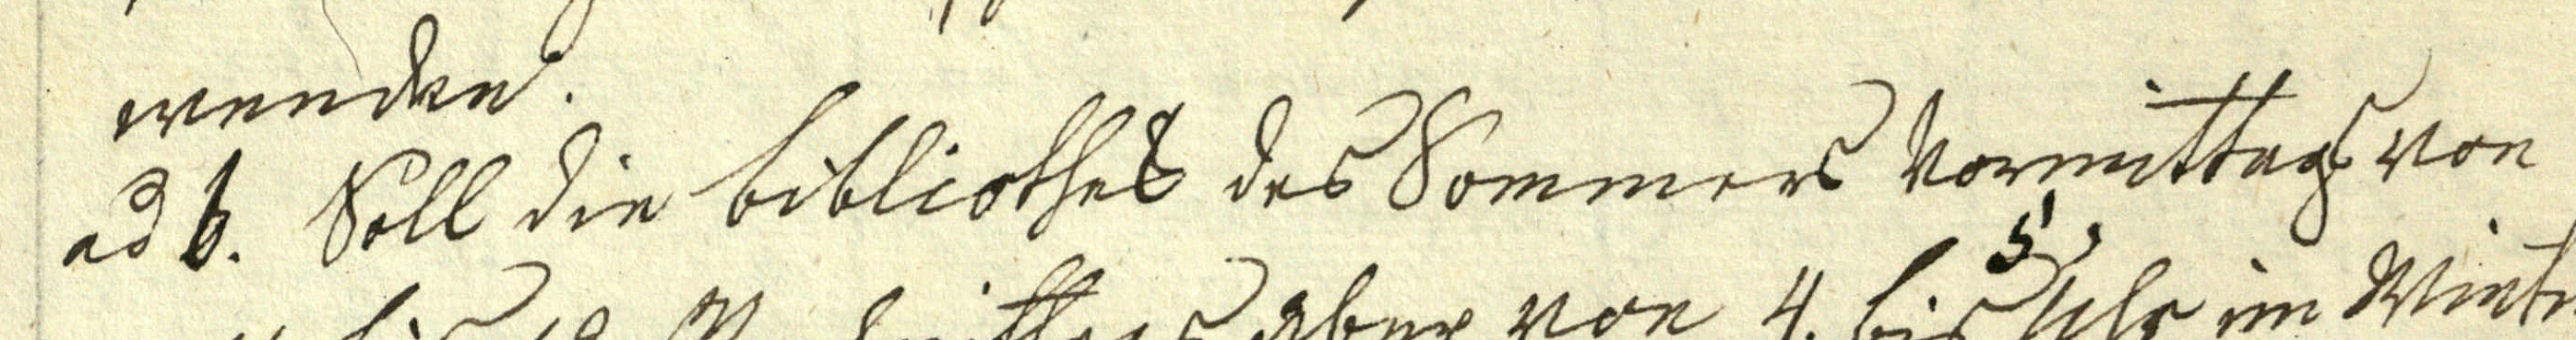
ad b. soll die Bibliothek des Sommers Vormittags von
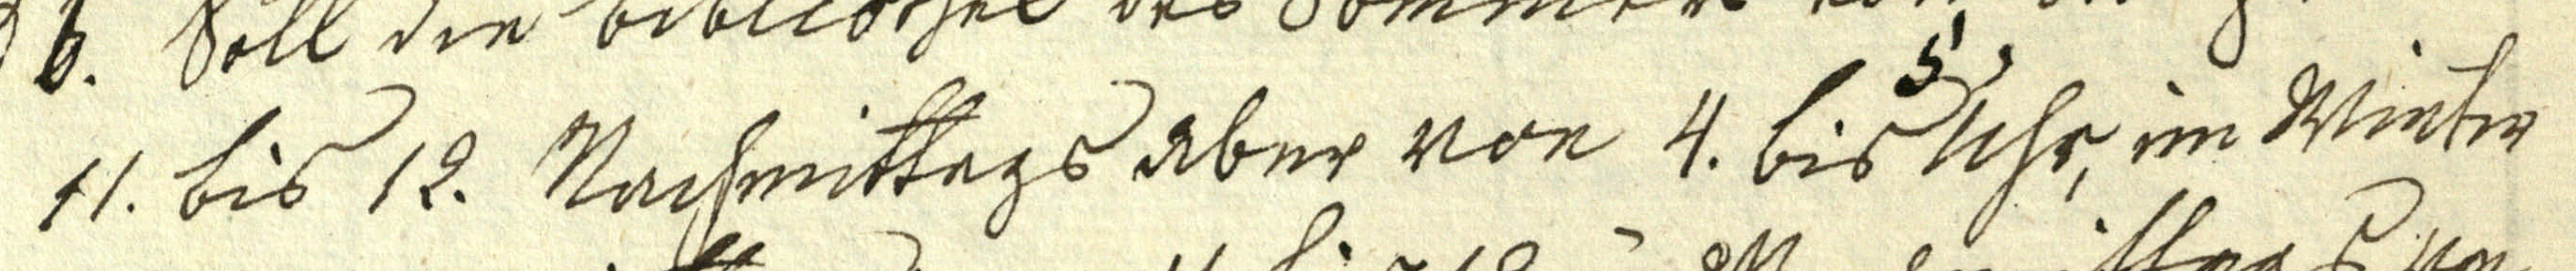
11. bis 12. Nachmittags aber von 4. bis 5. Uhr, im Winter
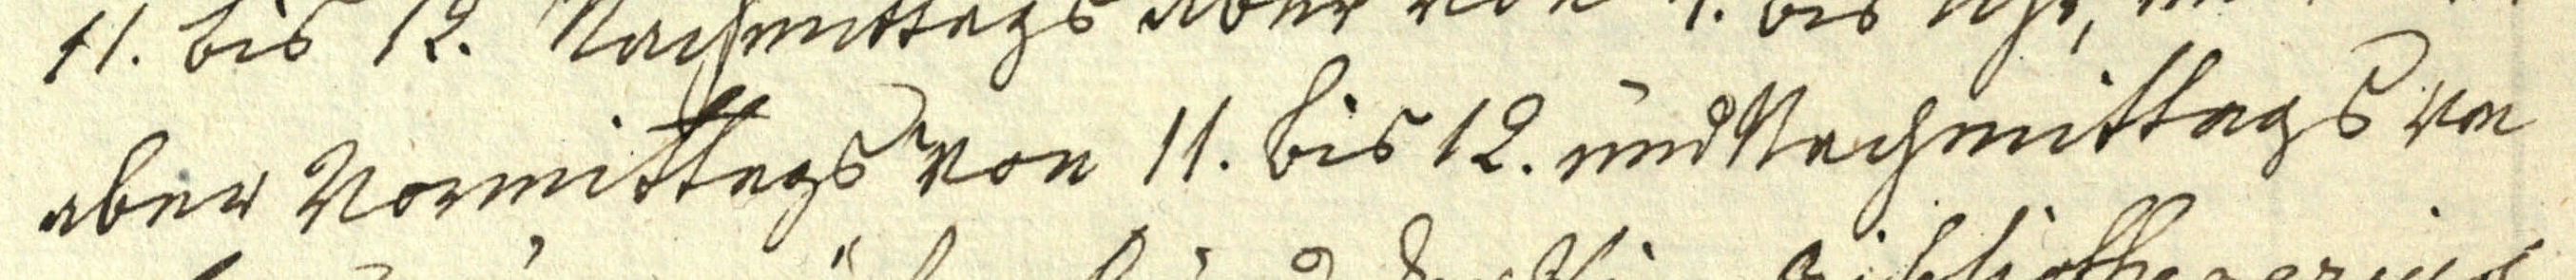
aber Vormittags von 11. bis 12. und Nachmittags von
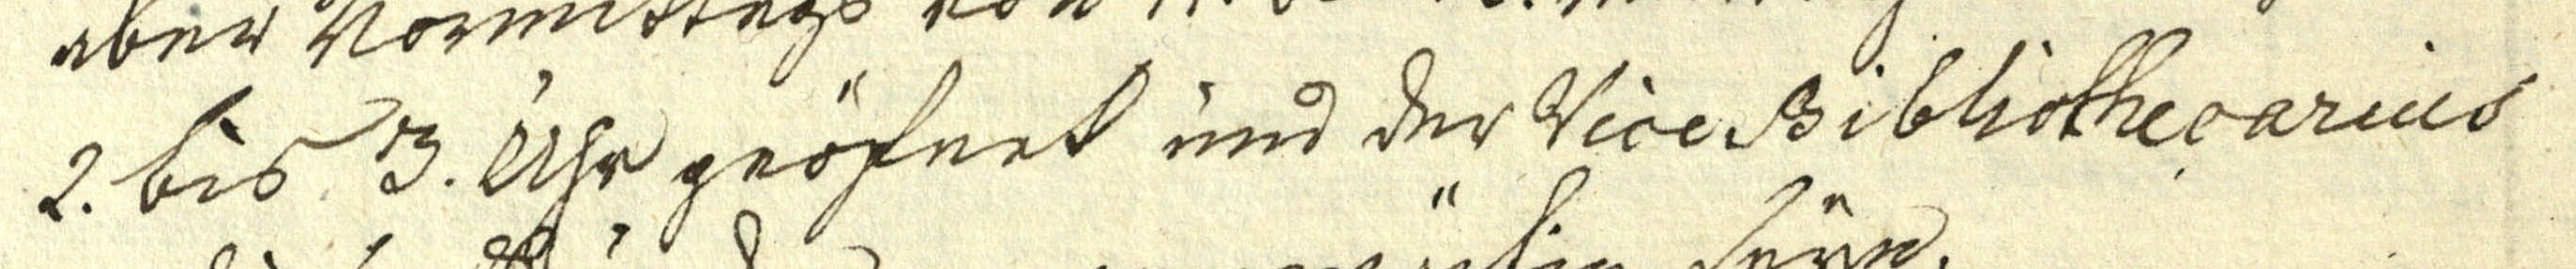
2 bis 3. Uhr geöfnet und der Vice Bibliothecarius
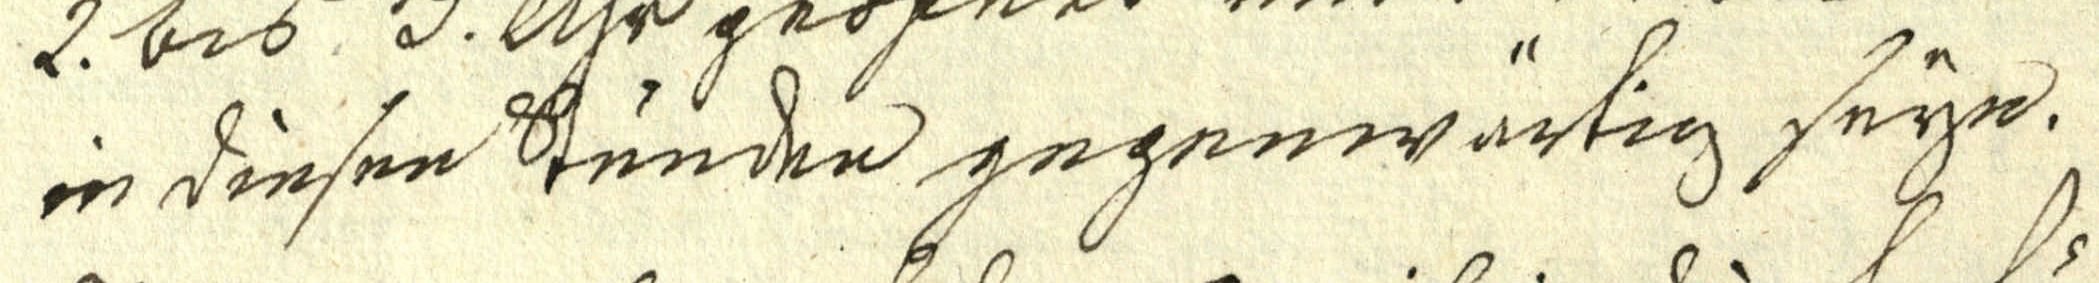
in diesen Stunden gegenwärtig seÿn.
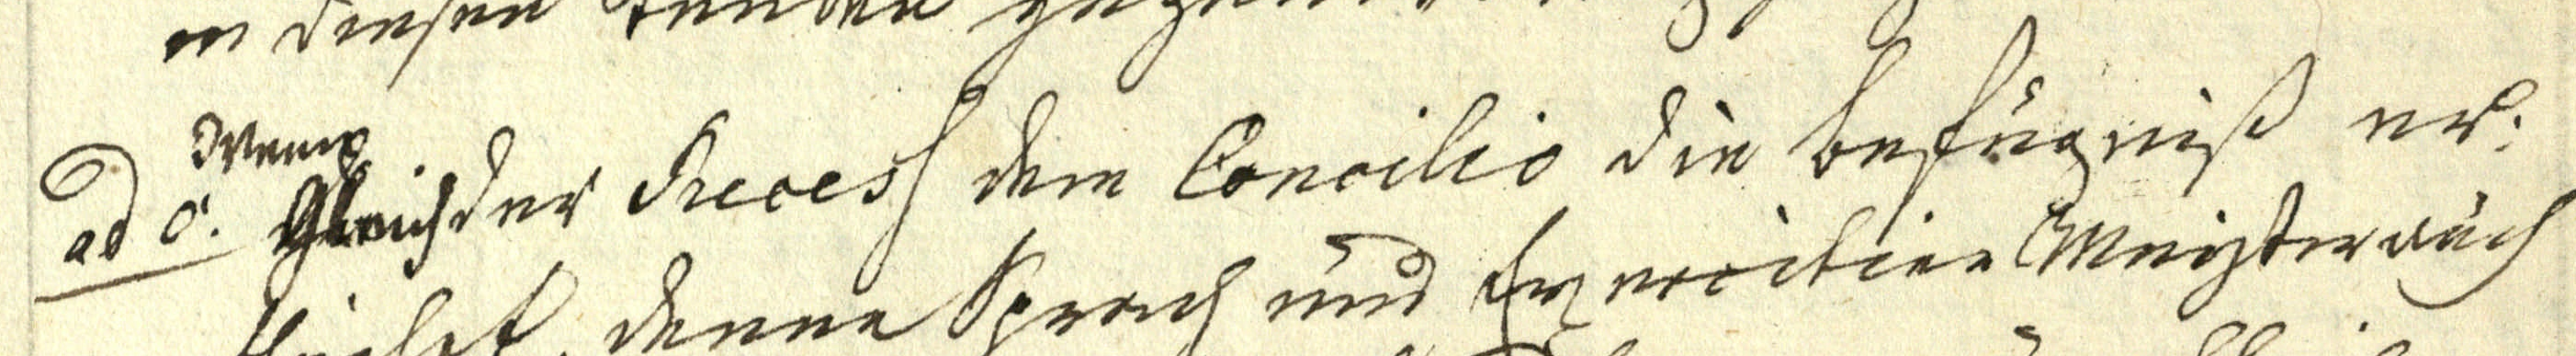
ad c. Wenn gleich der Recess dem Concilio die Befugniß er¬
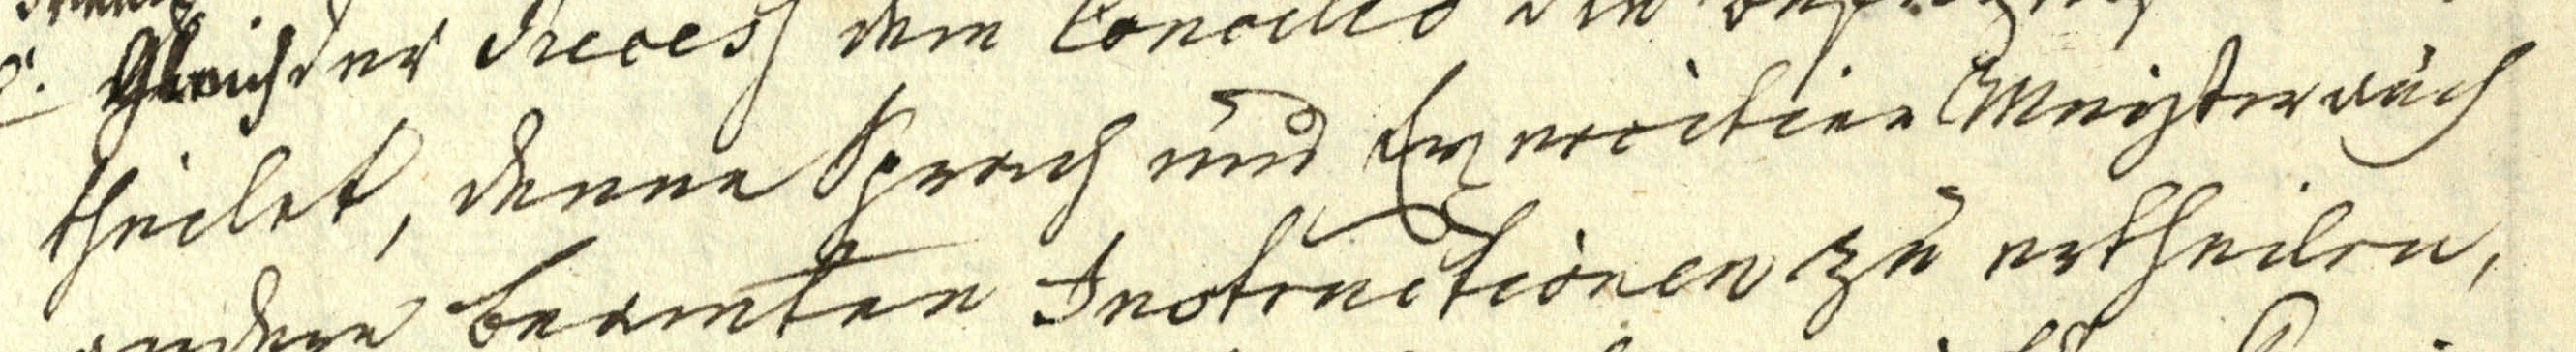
theilet, denen Sprach und Exercitien Meister auch
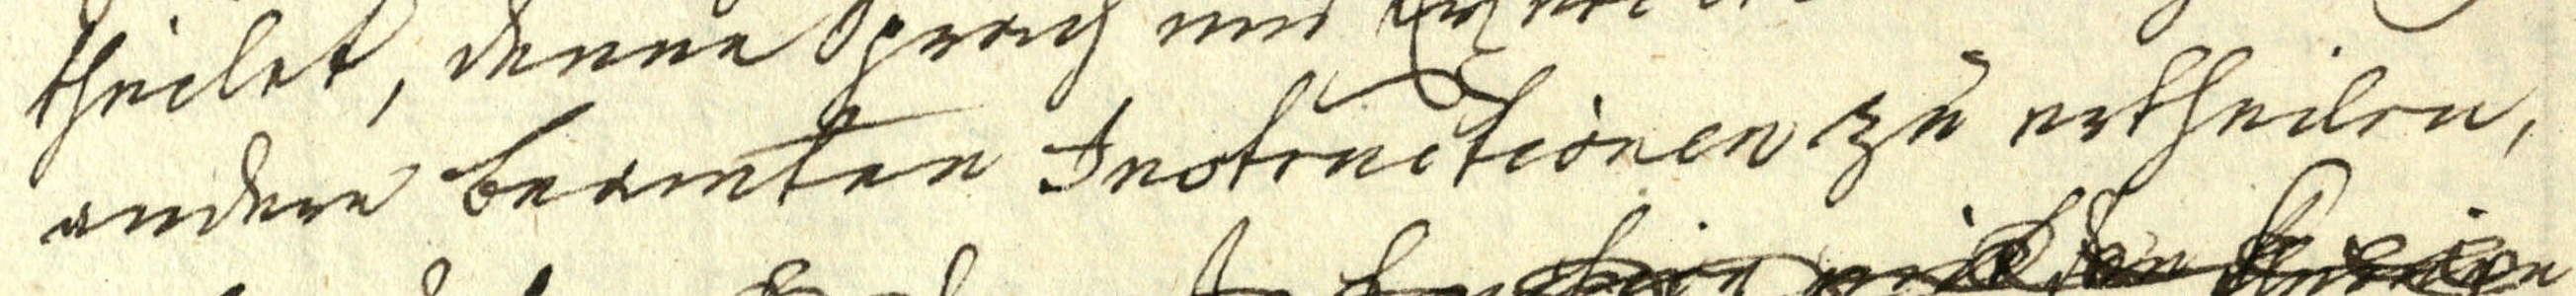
andern Beamten Instructionen zu ertheilen,
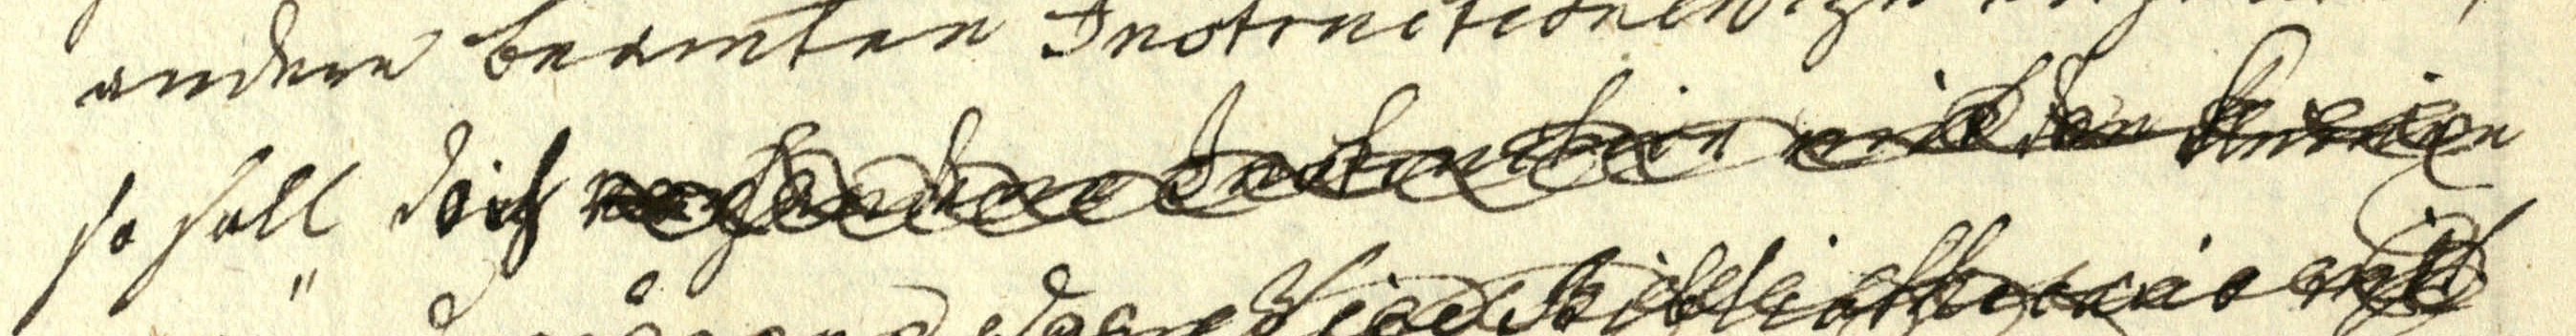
so soll doch vorhandene Instruction mit den kleinen
